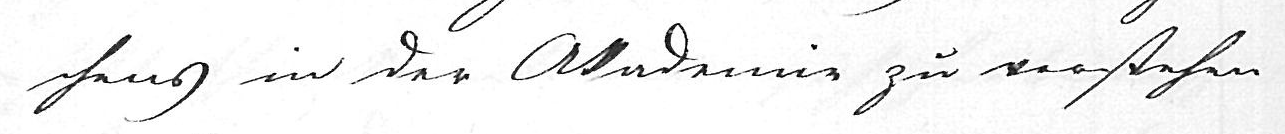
chen in der Akademie zu verstehen
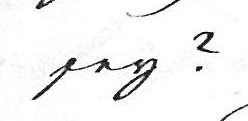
sey?
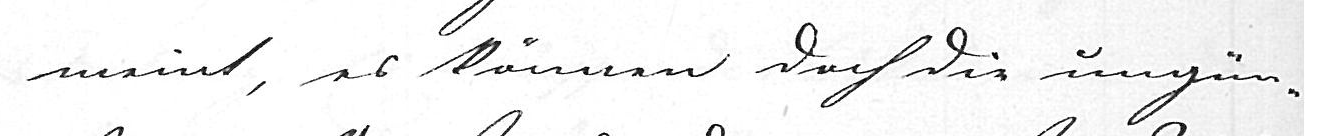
meint, es können doch die ungün-
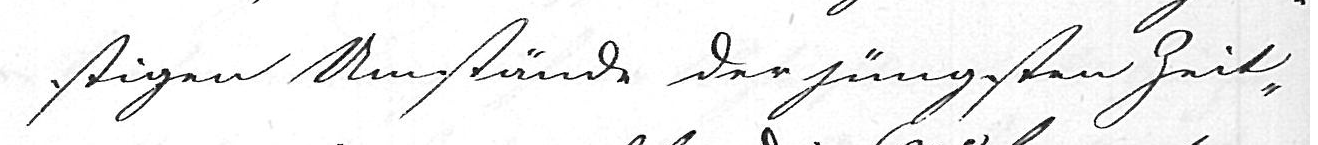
stigen Umstände der jüngsten Zeit-
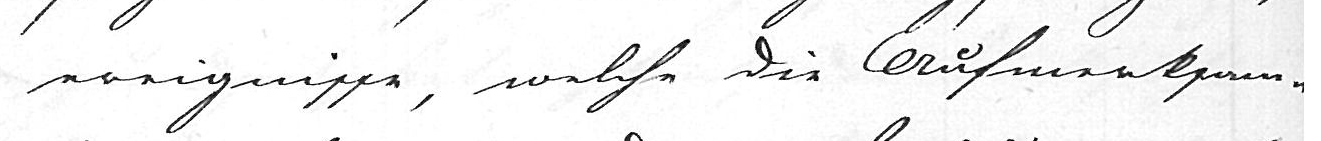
ereignisse, welche die Aufmerksam-
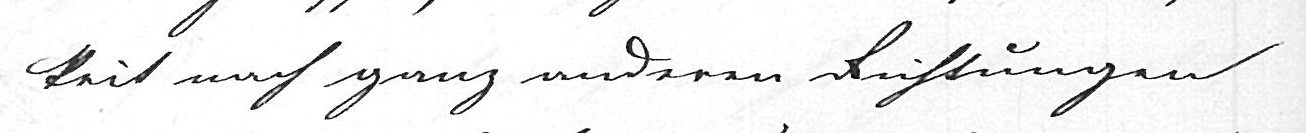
keit nach ganz anderen Richtungen
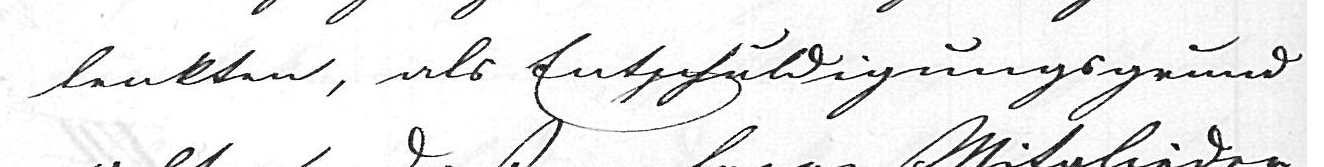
lenkten, als Entschuldigungsgrund
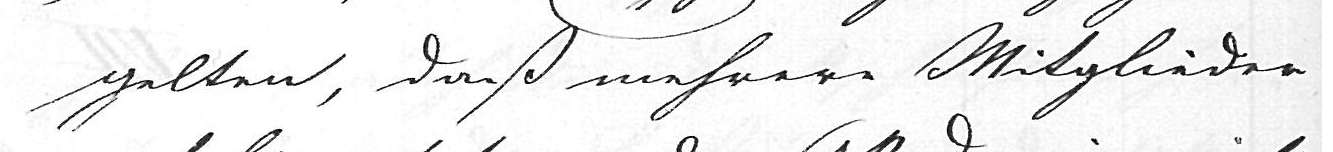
gelten, daß mehrere Mitglieder
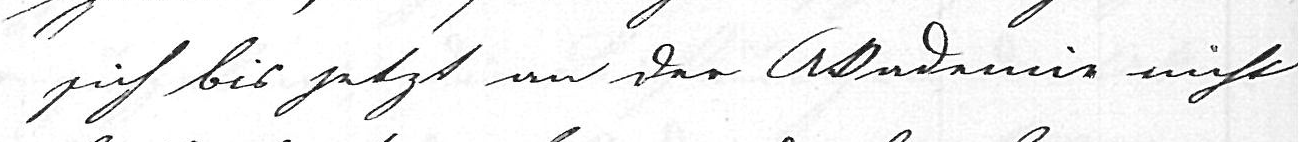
sich bis jetzt an der Akademie nicht
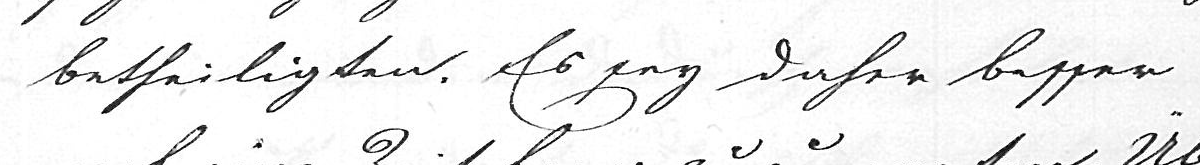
betheiligten. Es sey daher besser
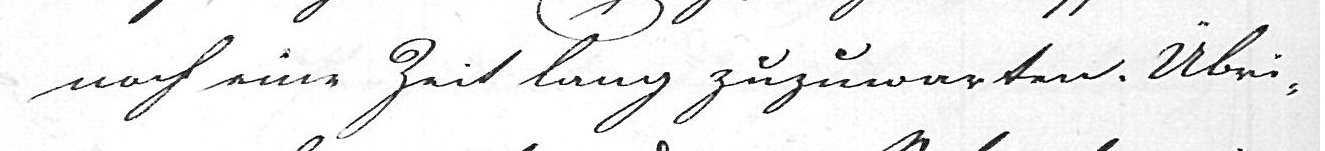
noch eine Zeit lang zuzuwarten. Uibri-
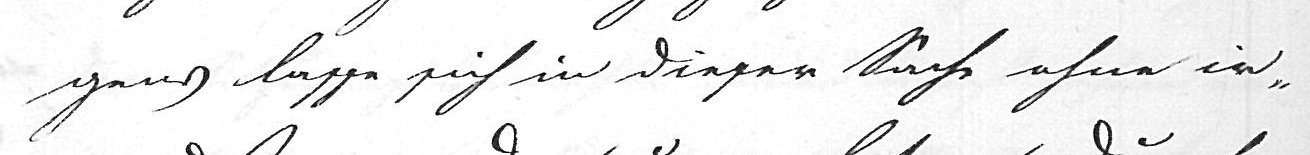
gens lasse sich in dieser Sache ohne ir-
